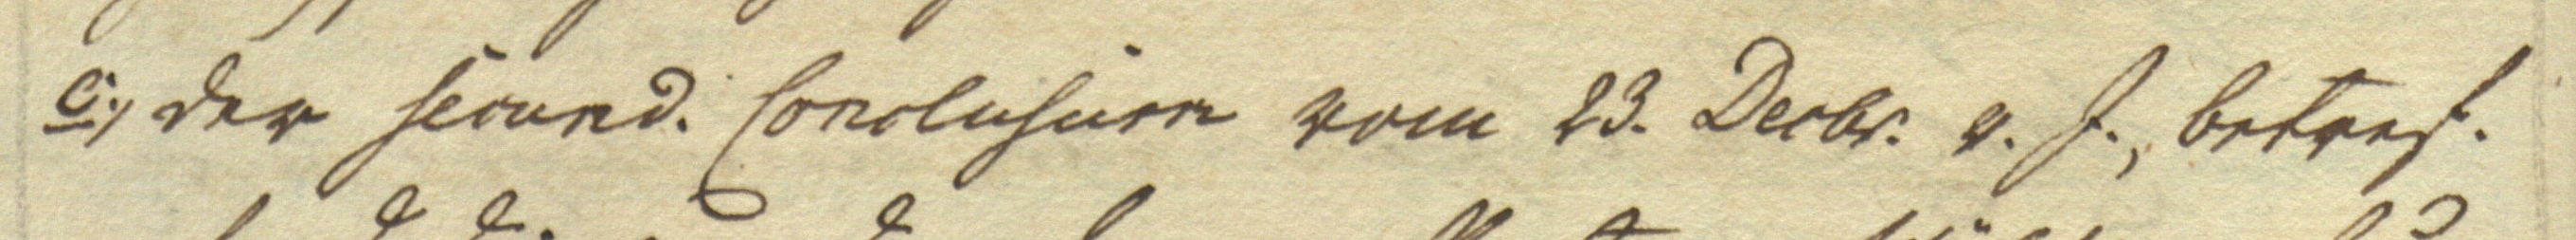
c., der secund. Conclusum vom 23. Decbr. v. J., betref¬
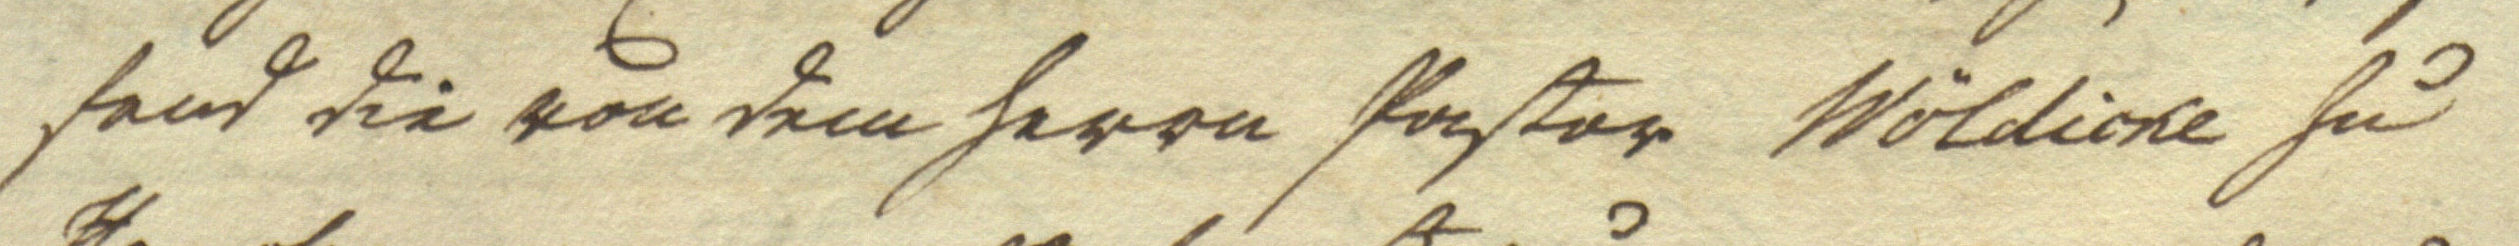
fand die von dem Herrn Pastor Wöldicke zu
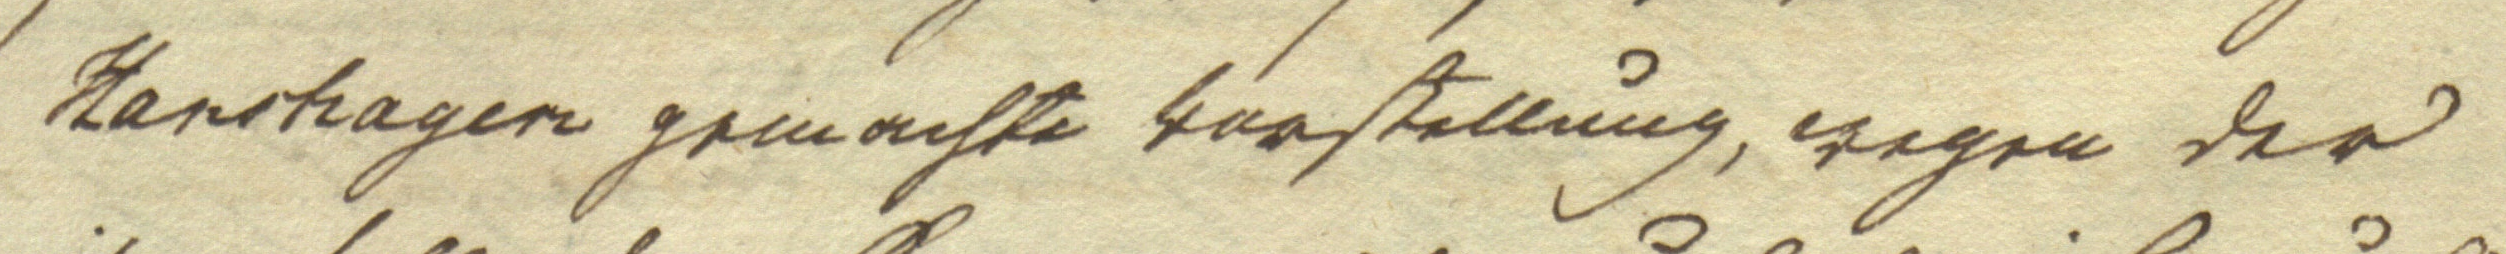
Hanshagen gemachte Vorstellung, wegen der
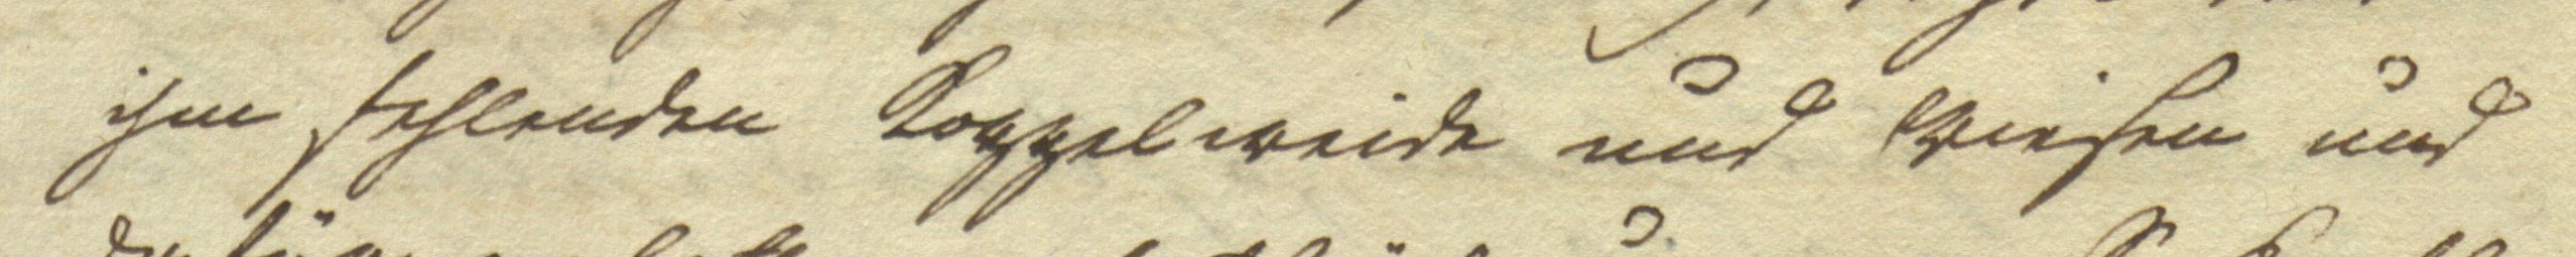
ihm fehlenden Koppelweide und Wiesen und
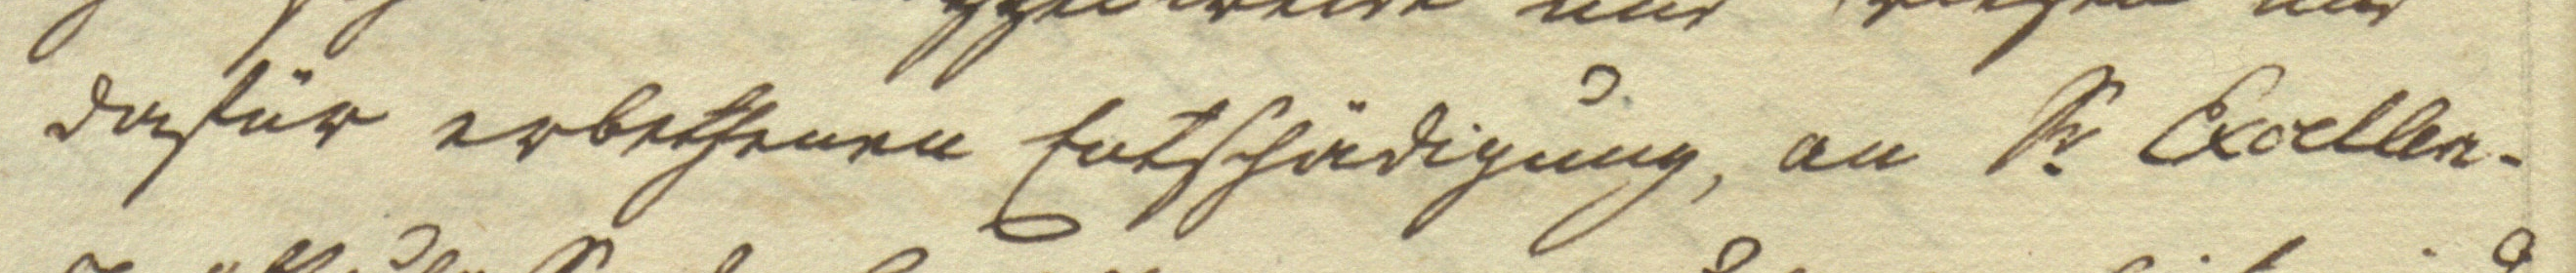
dafür erbethenen Entschädigung, an Sr Excellen¬
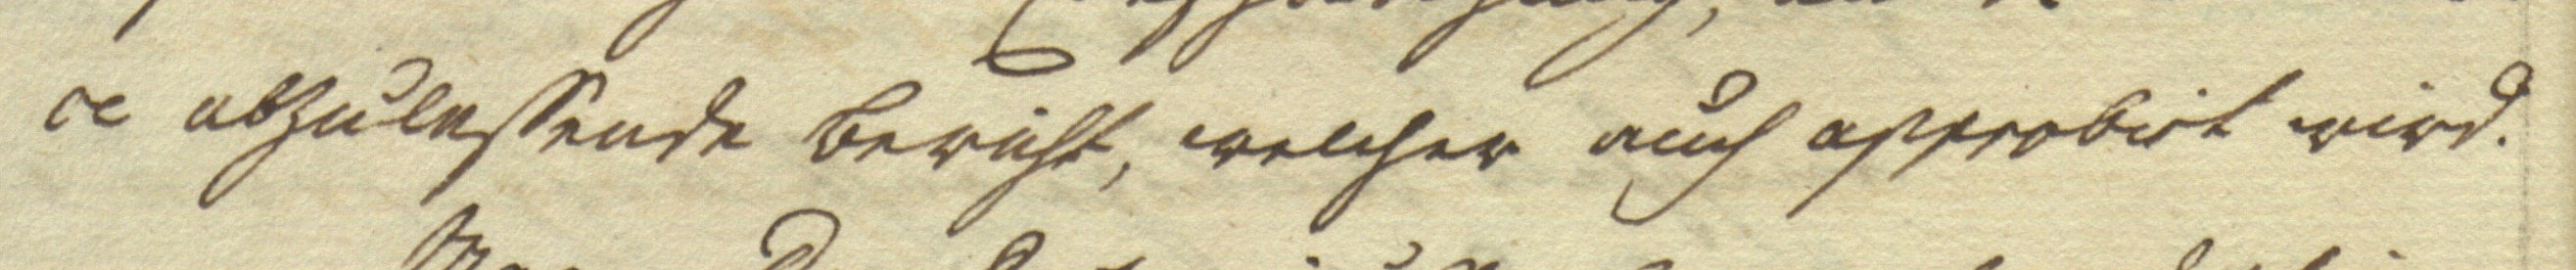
ce abzulassende Bericht, welcher auch approbirt wird.
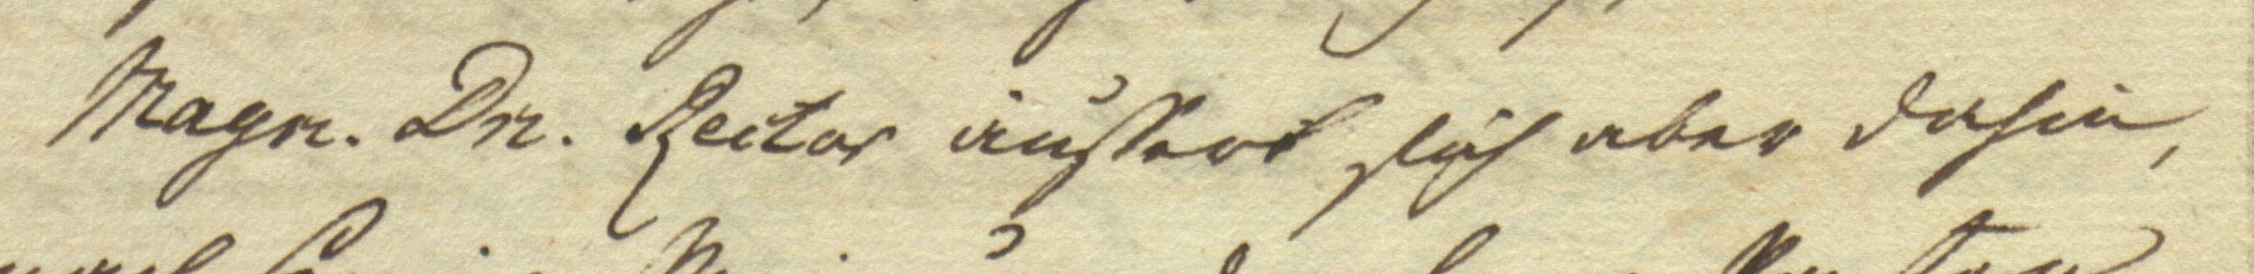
Magn. Dn. Rector äussert sich aber dahin,
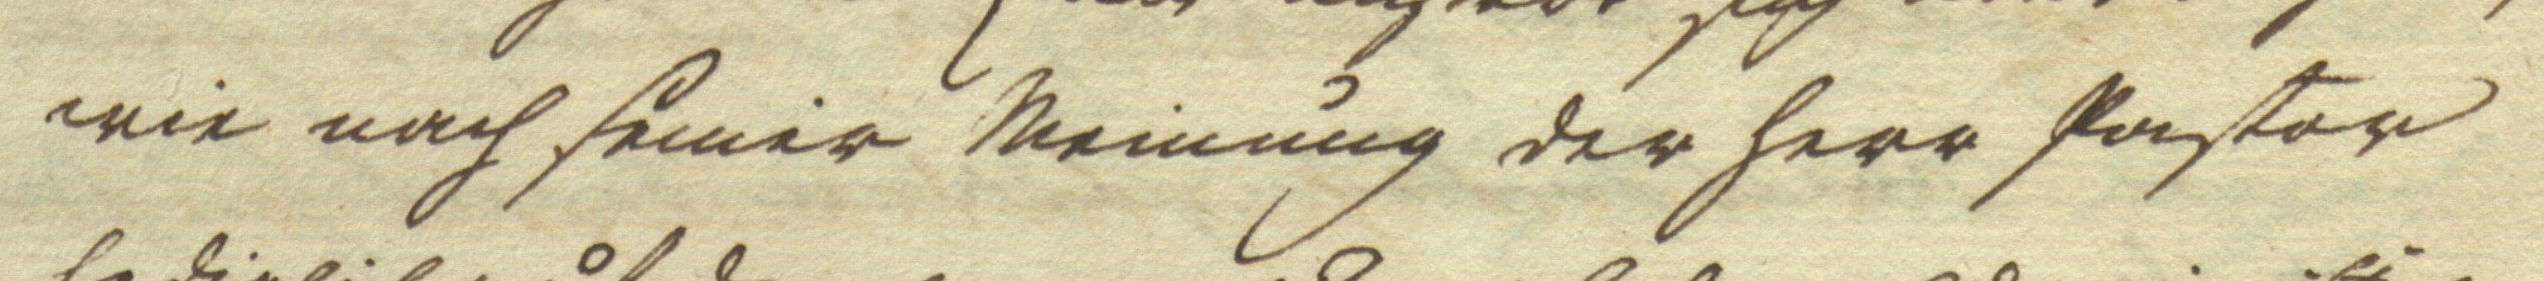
wie nach seiner Meinung der Herr Pastor
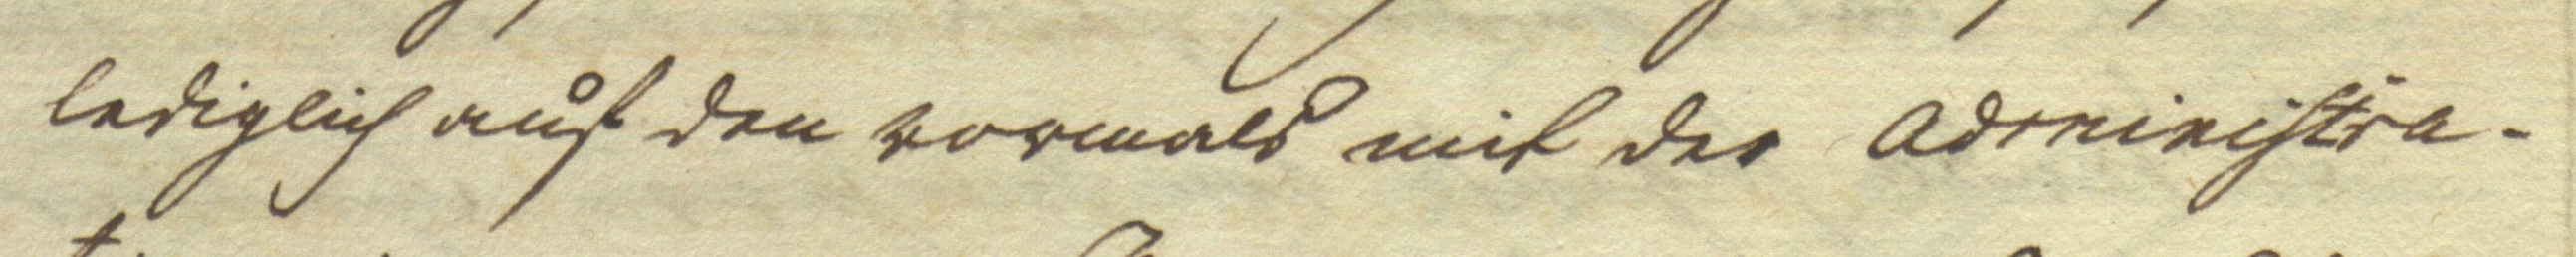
lediglich auf den vormals mit der Administra-
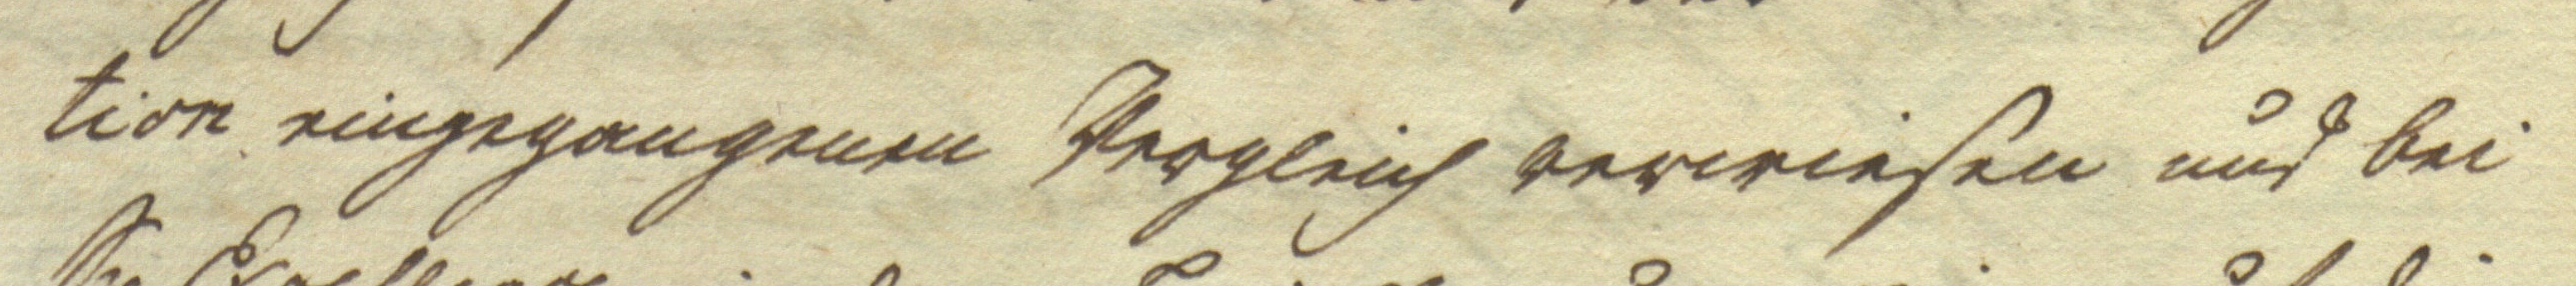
tion eingegangenen Vergleich verwiesen und bei
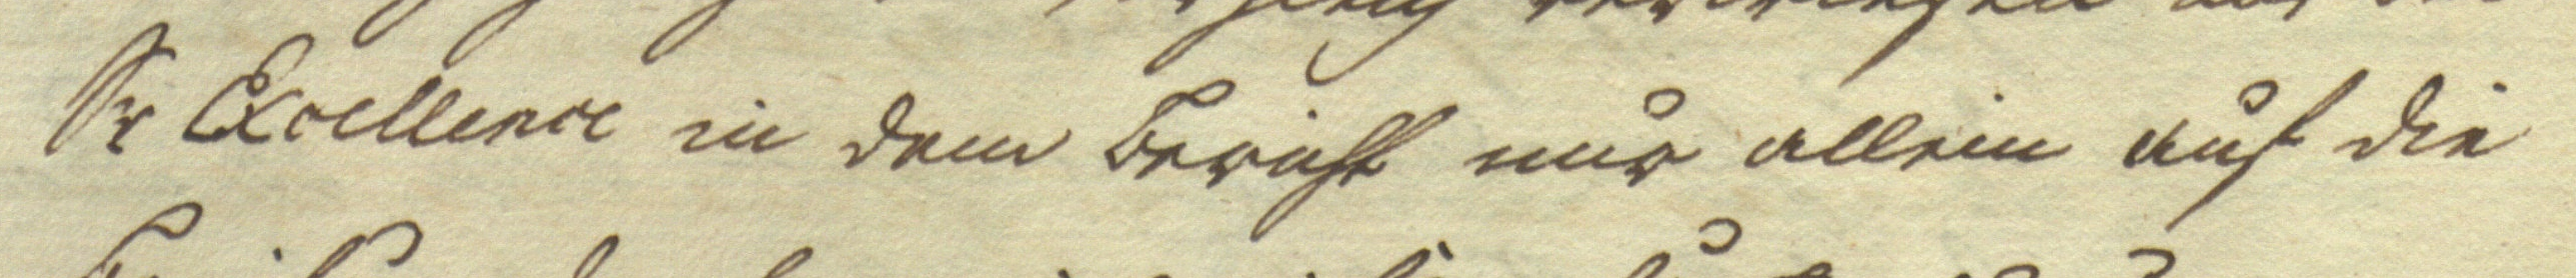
Sr Excellence in dem Bericht nur allein auf die
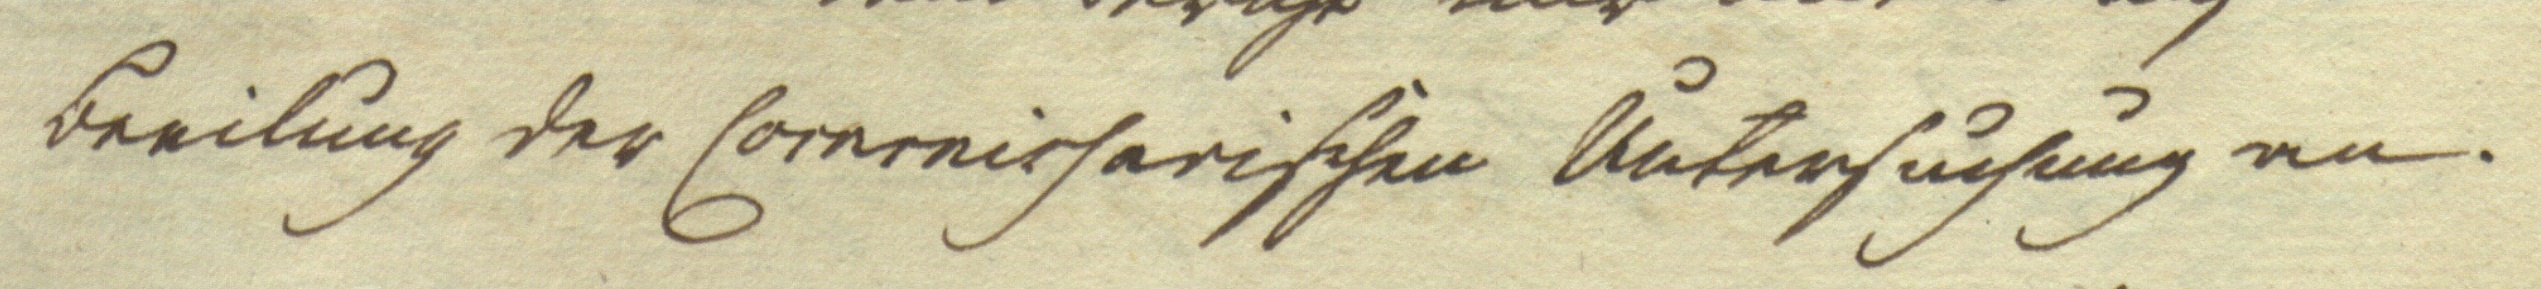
Beeilung der Commissarischen Untersuchung an¬
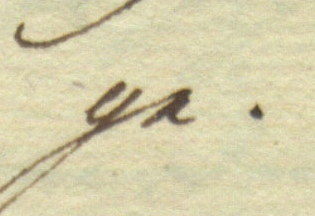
ge¬
